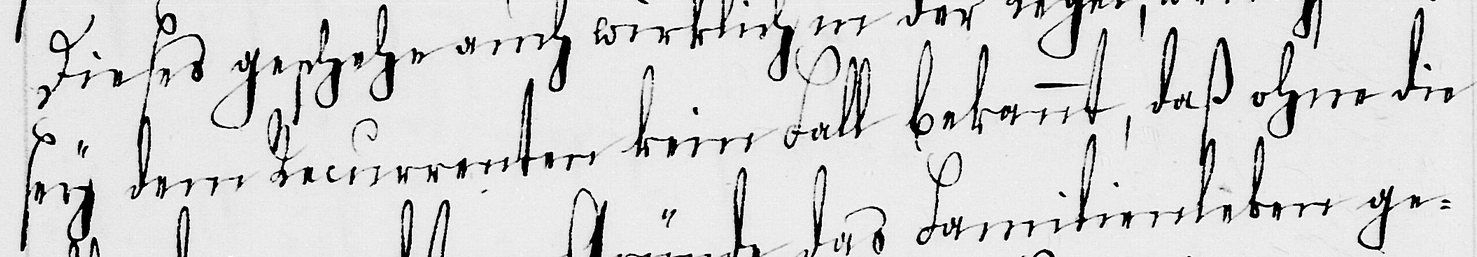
sey dem Recurrenten kein Fall bekannt, daß ohne die
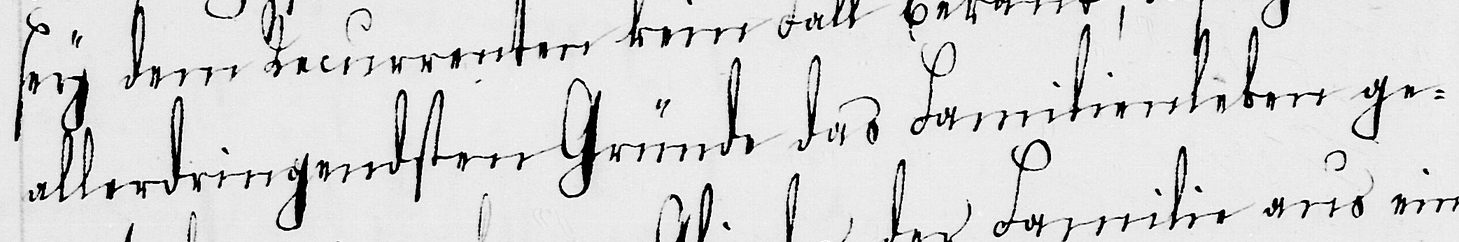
allerdringendsten Gründe das Familienleben ge¬
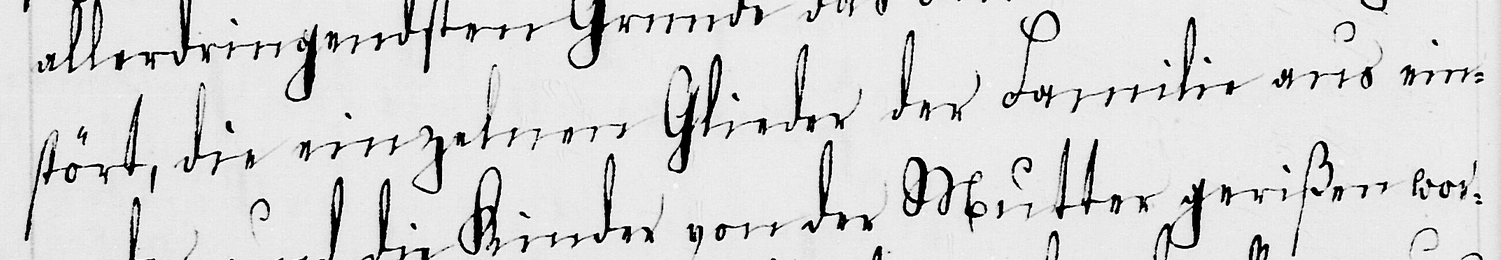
stört, die einzelnen Glieder der Familie aus ein¬
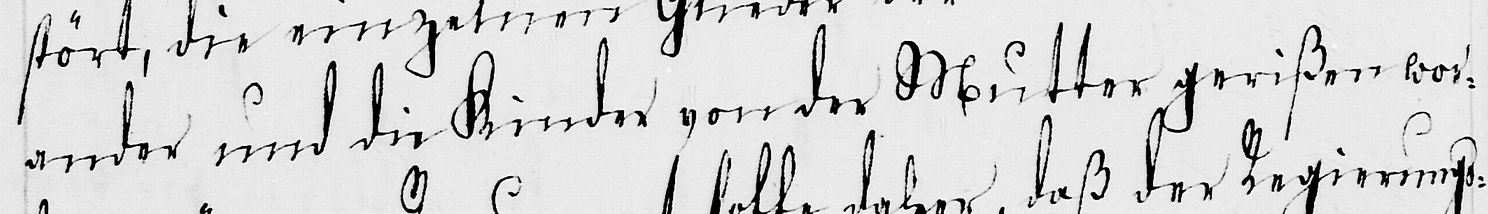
ander und die Kinder von der Mutter gerißen wor¬
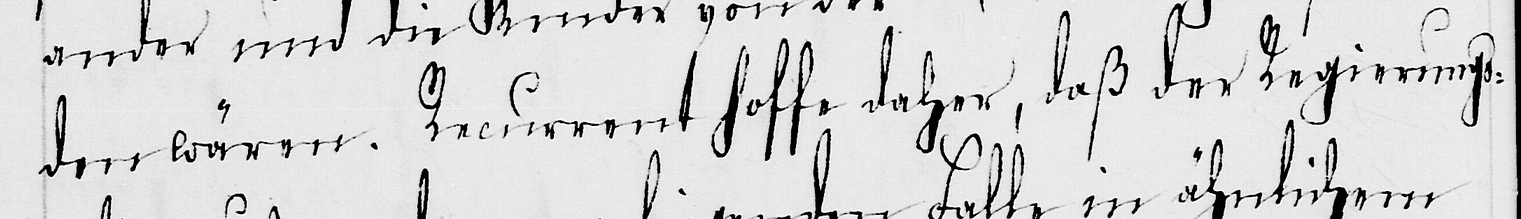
den wären. Recurrent hoffe daher, daß der Regierungs¬
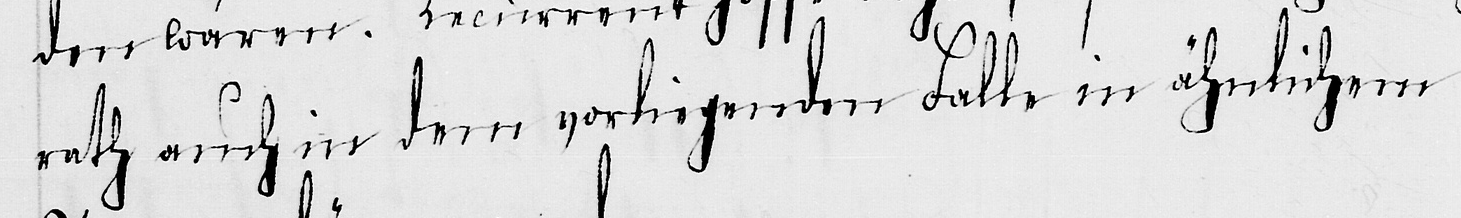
rath auch in dem vorliegenden Falle in ähnlichem
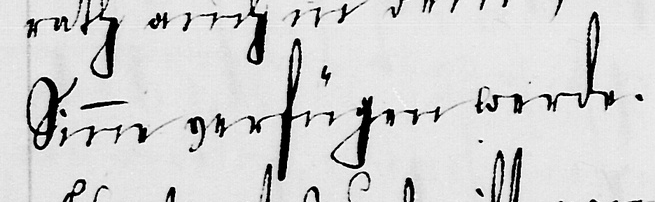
Sinne verfügen werde.
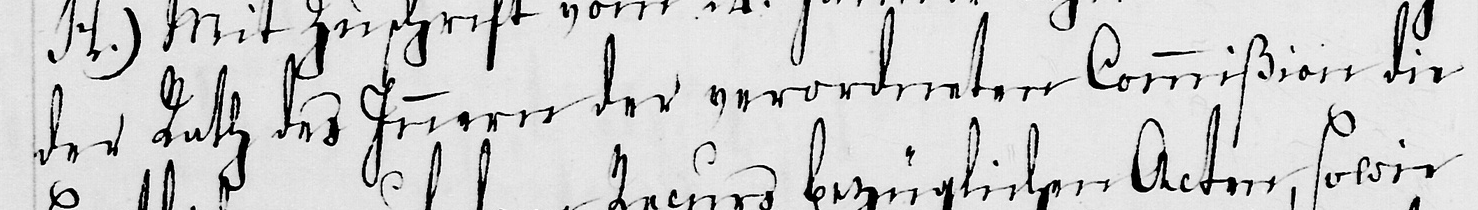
der Rath des Innern der verordneten Commißion die
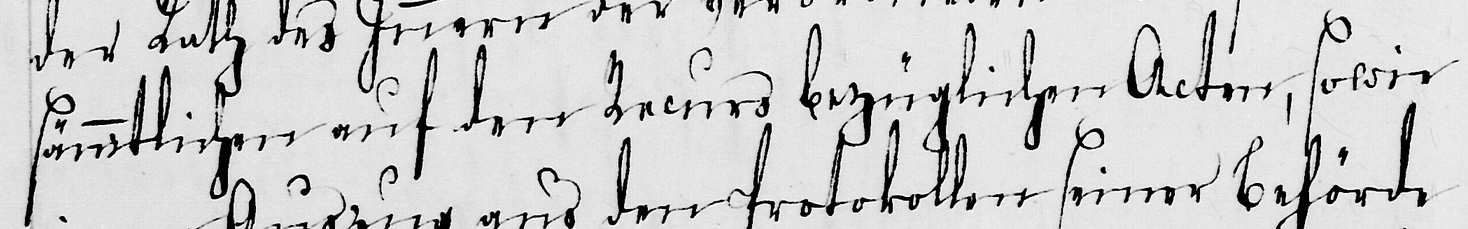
sämmtlichen auf den Recurs bezüglichen Acten, sowie
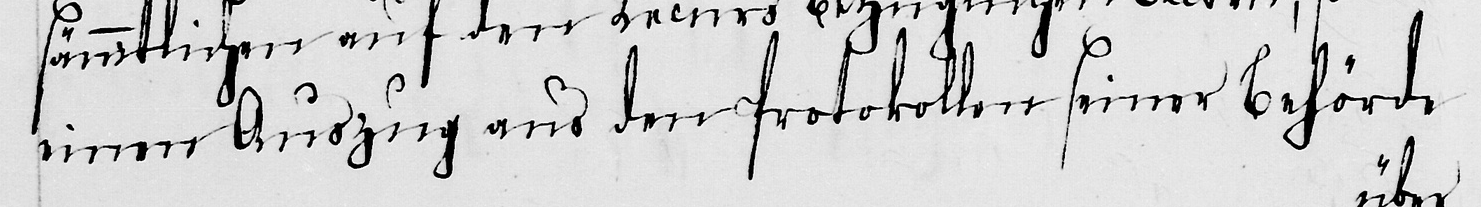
einen Auszug aus den Protokollen seiner Behörde
